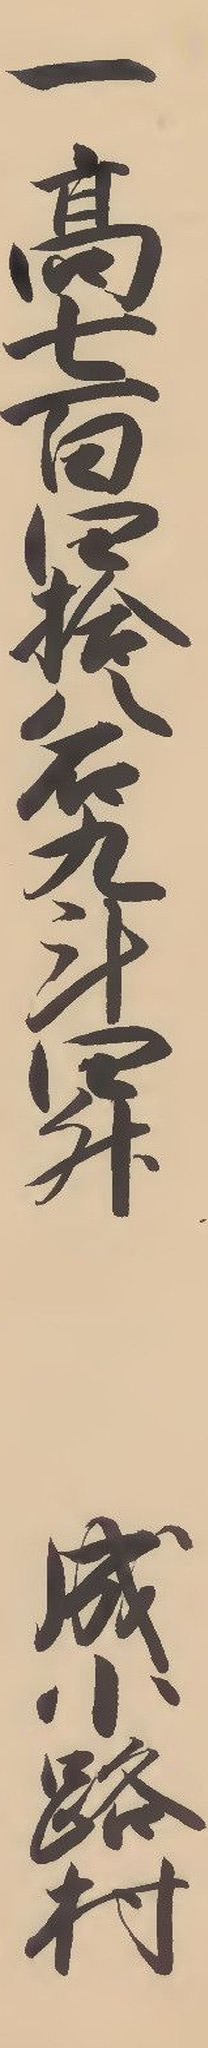一高七百四拾八石九斗四升成小路村

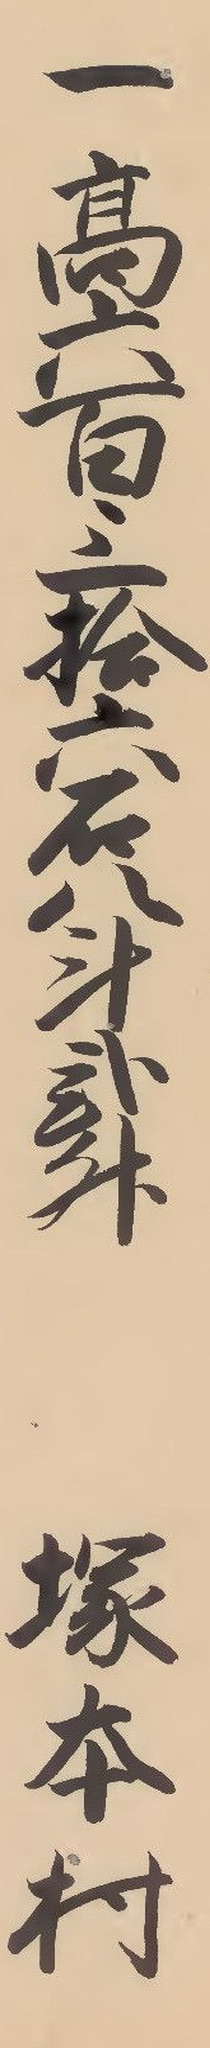一高六百三拾六石八斗弐升塚本村
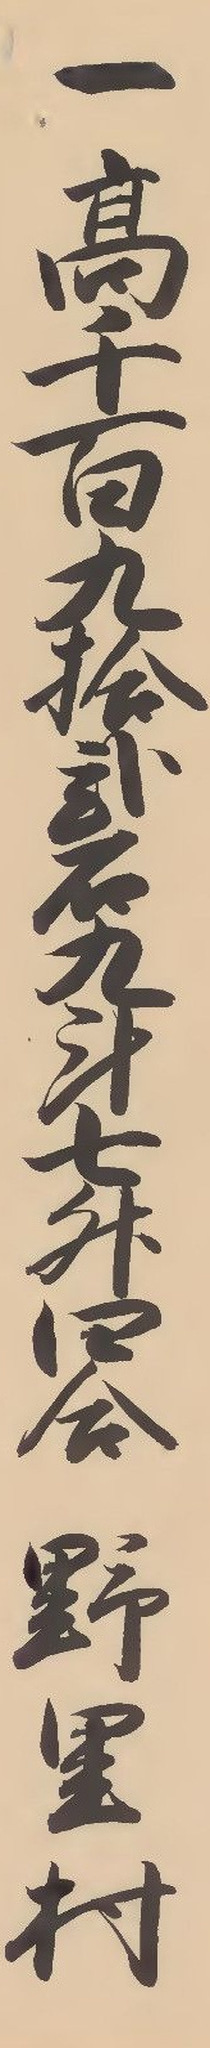一高千百九拾弐石九斗七升四合野里村
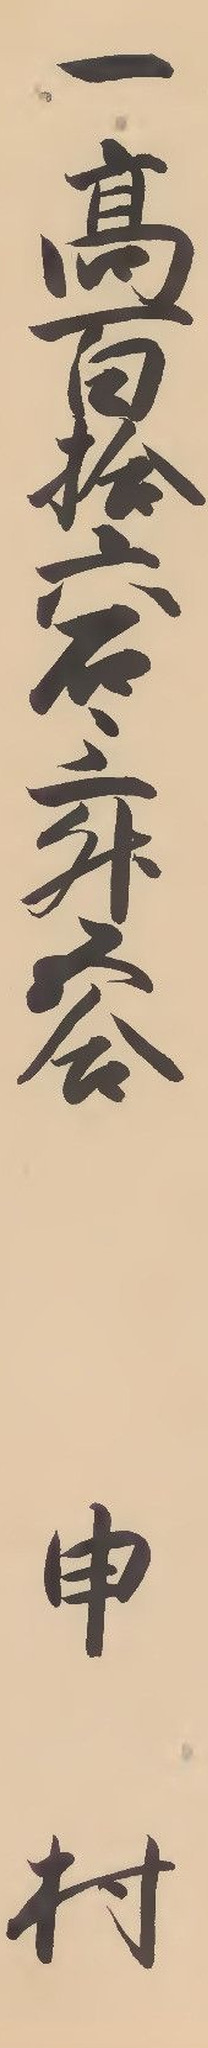一高百拾六石三升五合申村
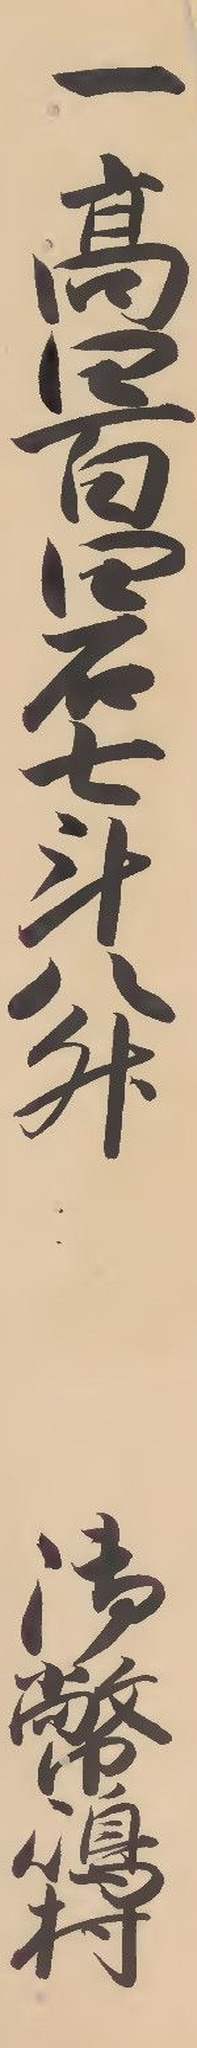一高四百四石七斗八升御幣島村
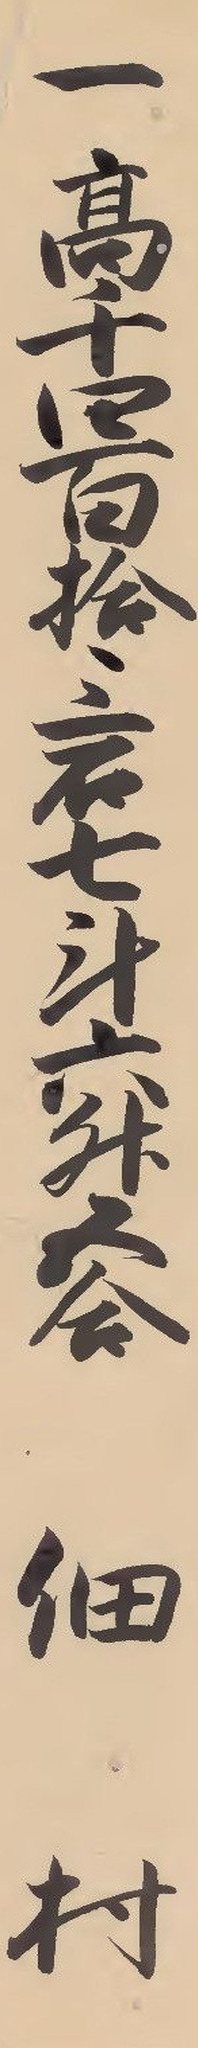一高千四百拾三石七斗六升五合佃村
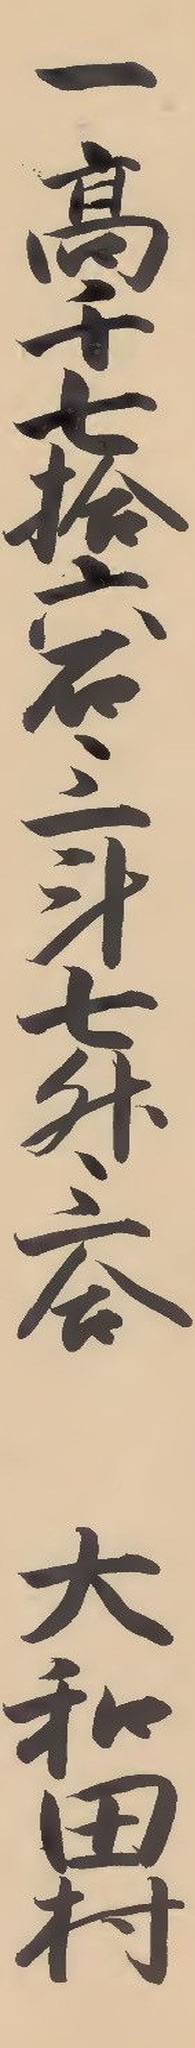一高千七拾六石三斗七升三合大和田村
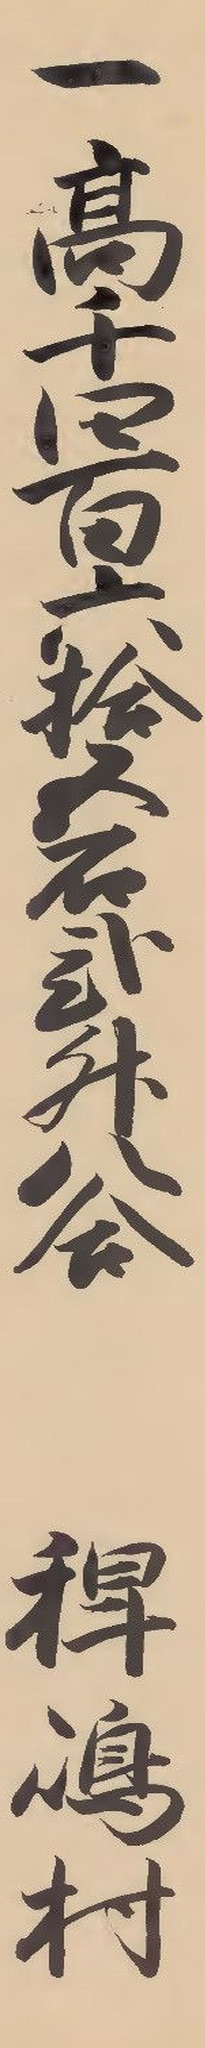一高千四百六拾五石弐升八合稗島村
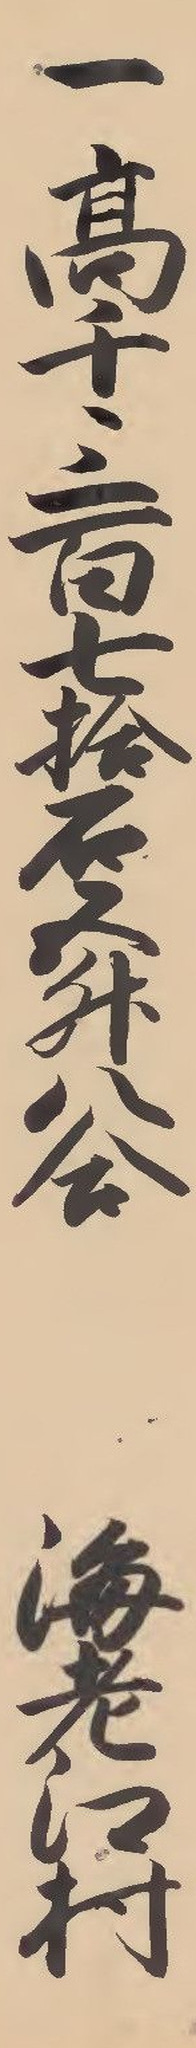一高千三百七拾石五升八合海老江村

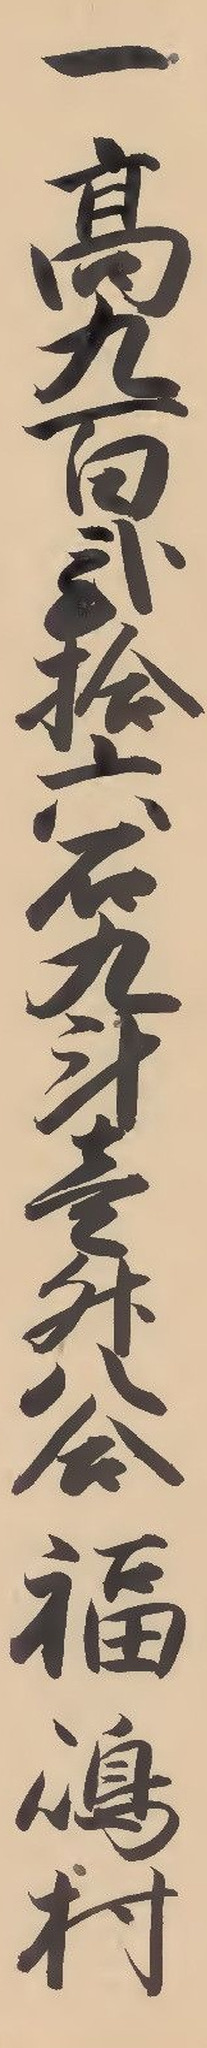一高九百弐拾六石九斗壱升八合福島村
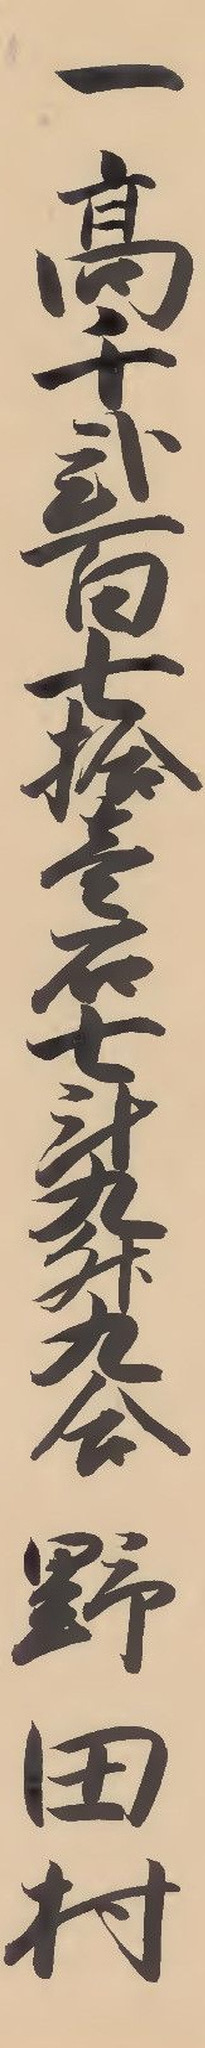一高千弐百七拾壱石七斗九升九合野田村
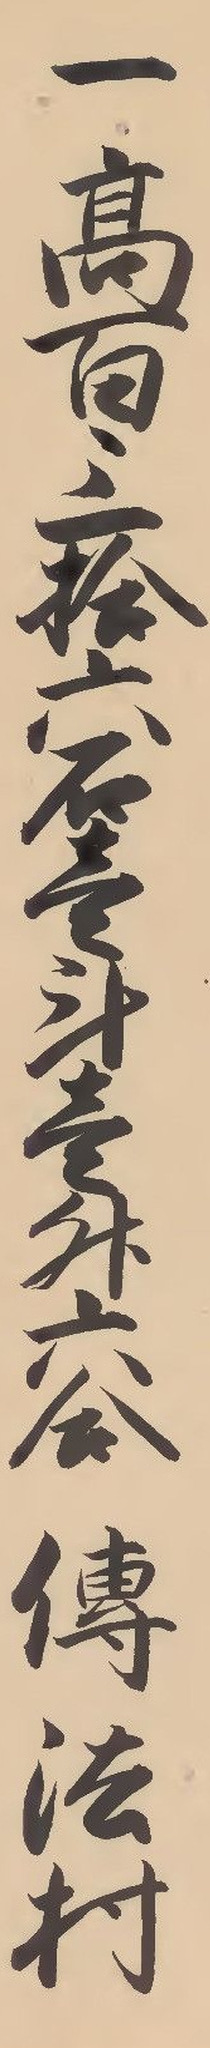一高百三拾六石壱斗壱升六合伝法村
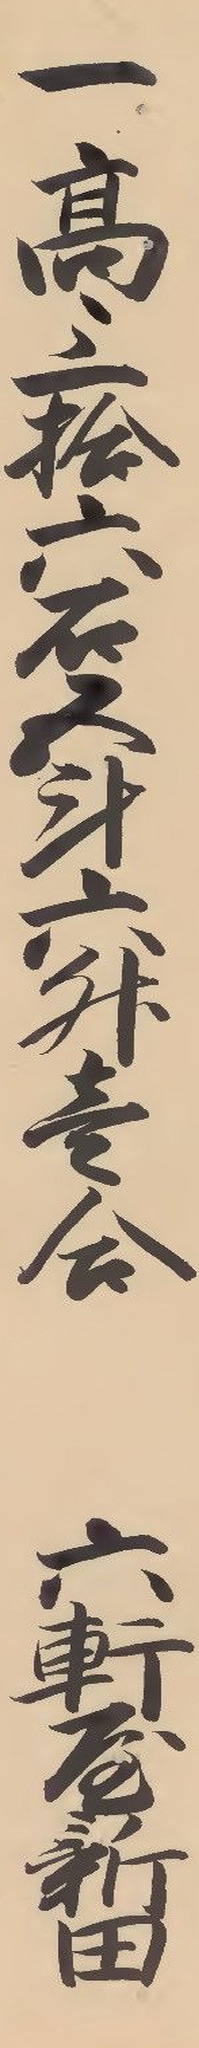一高三拾六石五斗六升壱合六軒屋新田
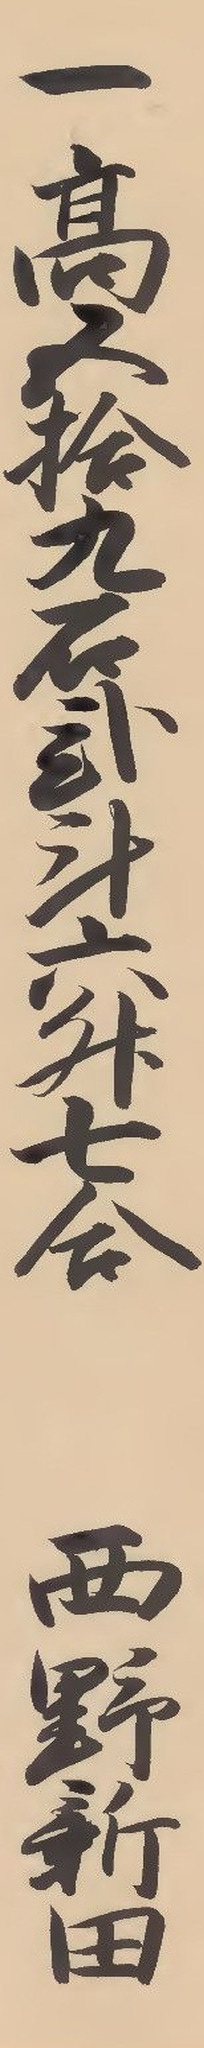一高五拾九石弐斗六升七合西野新田
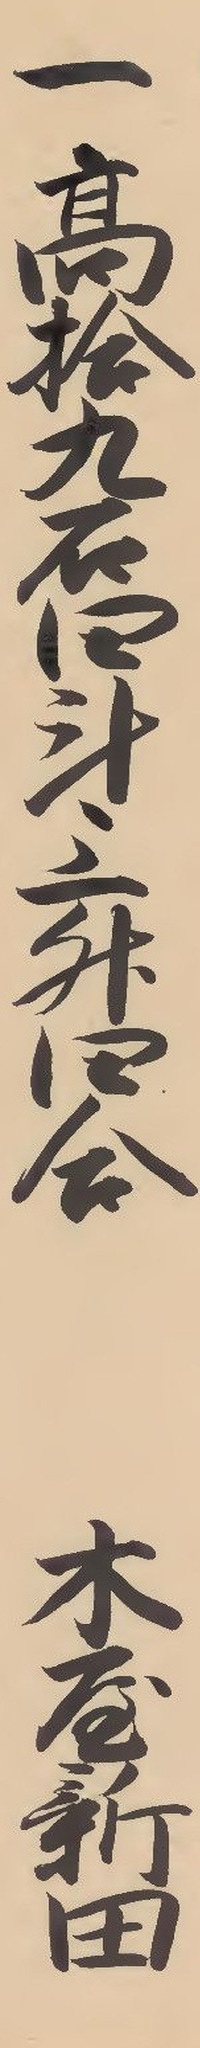一高拾九石四斗三升四合木屋新田
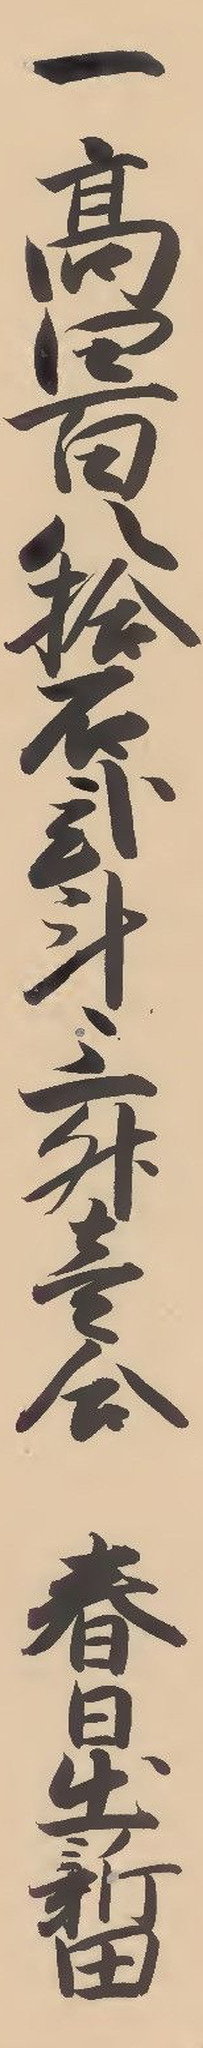一高四百八拾石弐斗三升壱合春日出新田
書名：摂津国郷帳
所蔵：国立公文書館 National Archives of Japan
